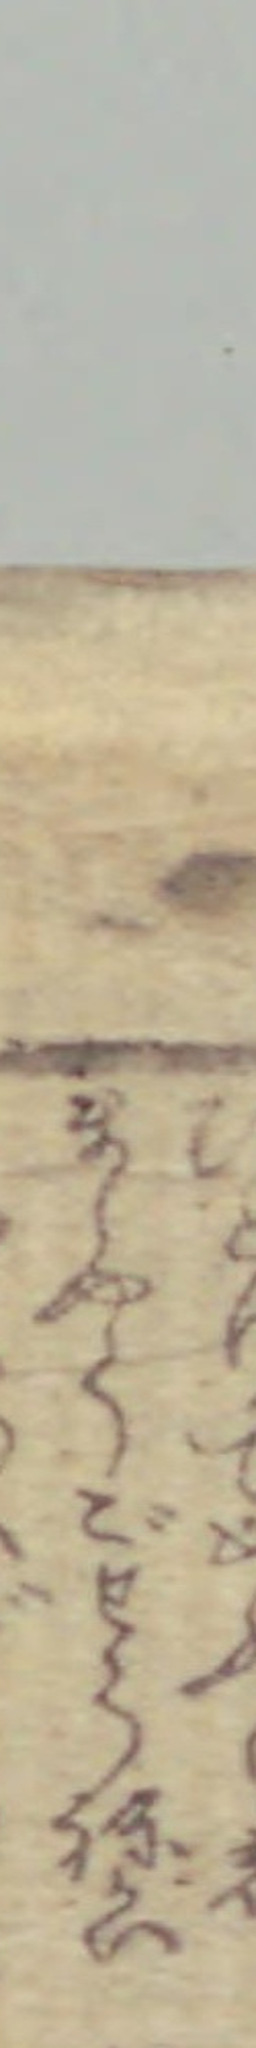ましやうごせうねかい
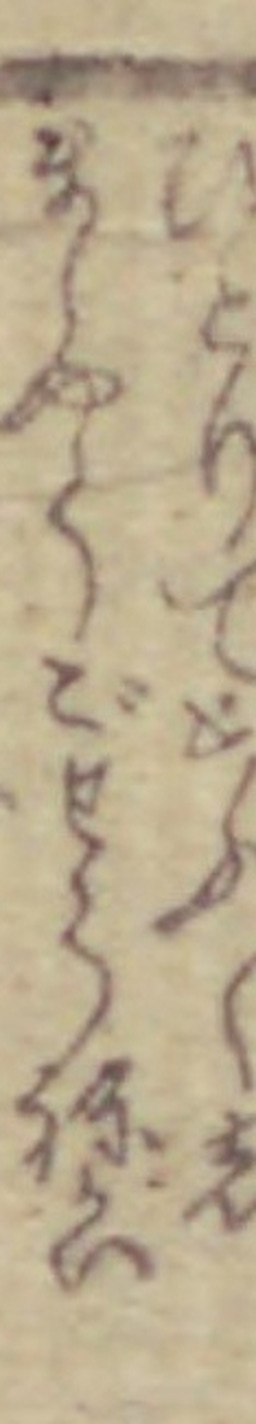ましやうごせうねかい
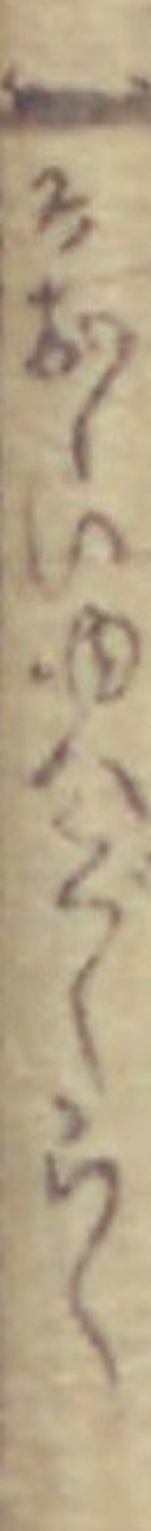かおゝいゆへごくらく
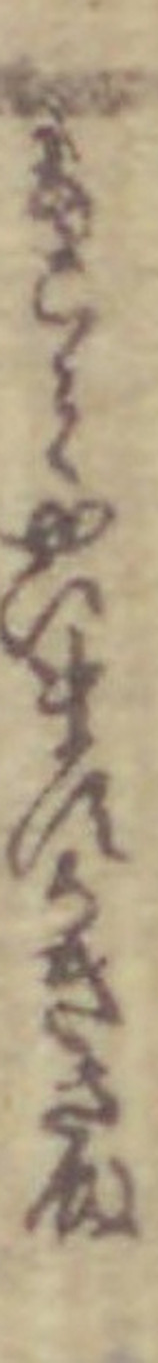もこみやいますかきさま
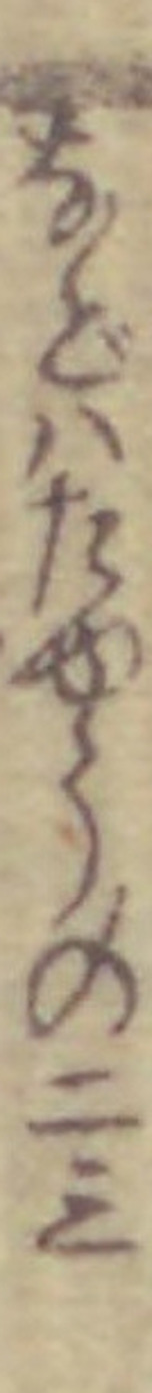などはたゆうの二三
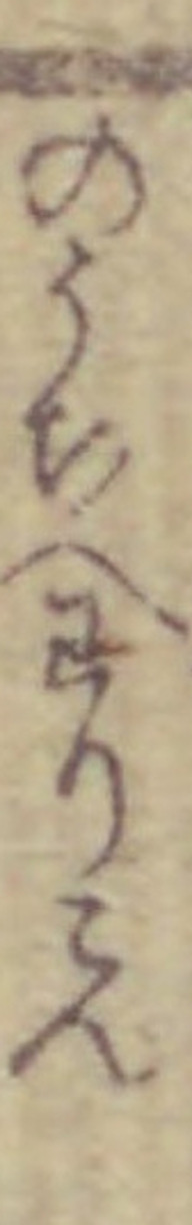のうちへわりこん
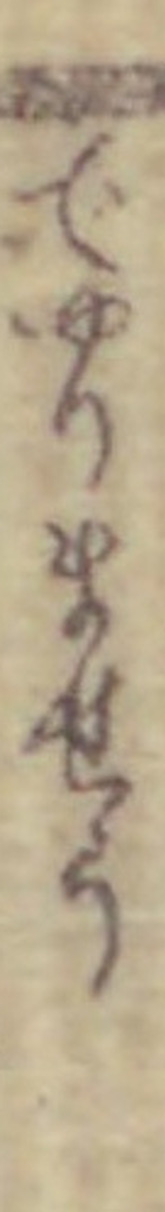でやりませう
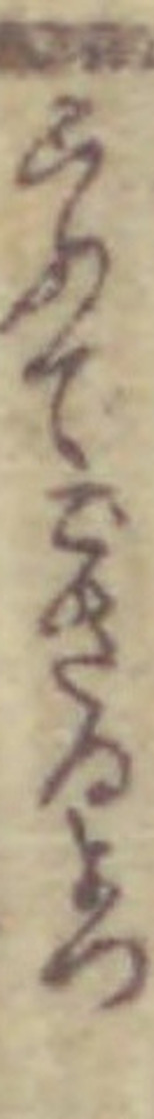とふてごさるよつ
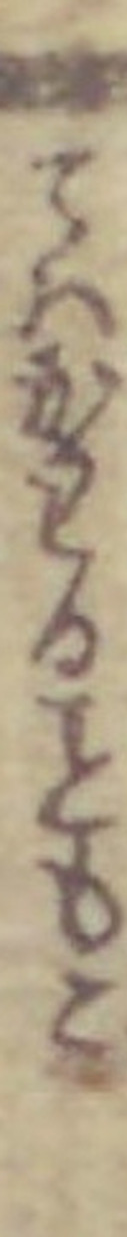てはかわることもこ
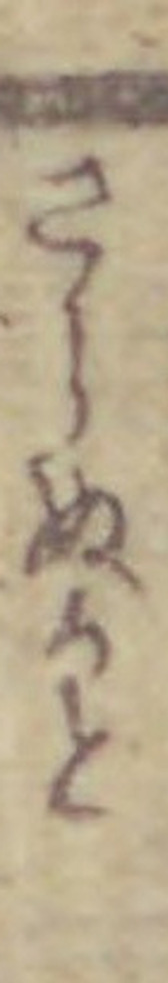さらぬかと
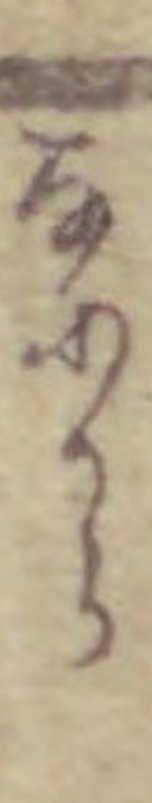なにから
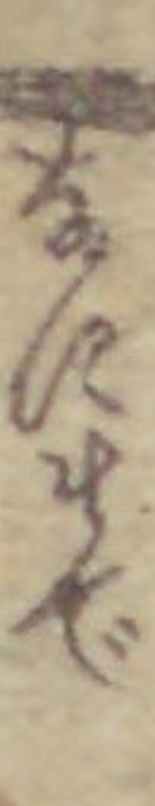なにまで
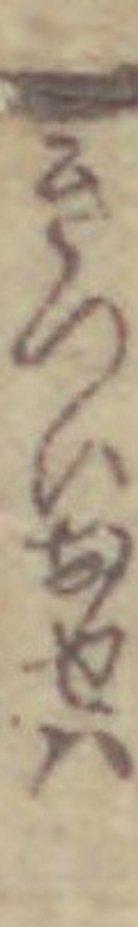きついおせは
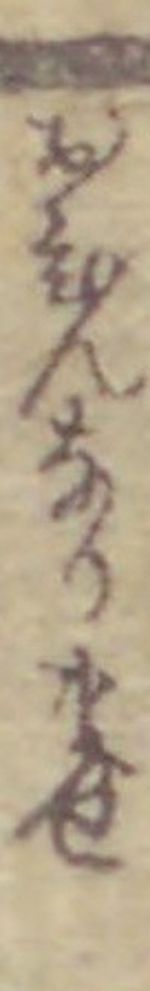おひんなりませ

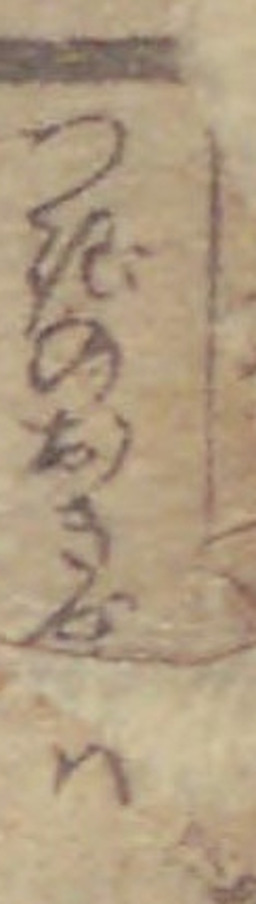つきのおきやくは
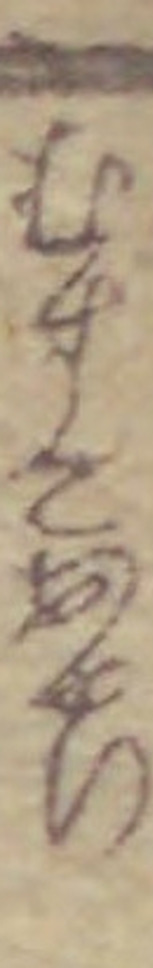むすこおやち
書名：思事夢濃枕 3巻
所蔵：国立国会図書館 National Diet Library, JAPAN
